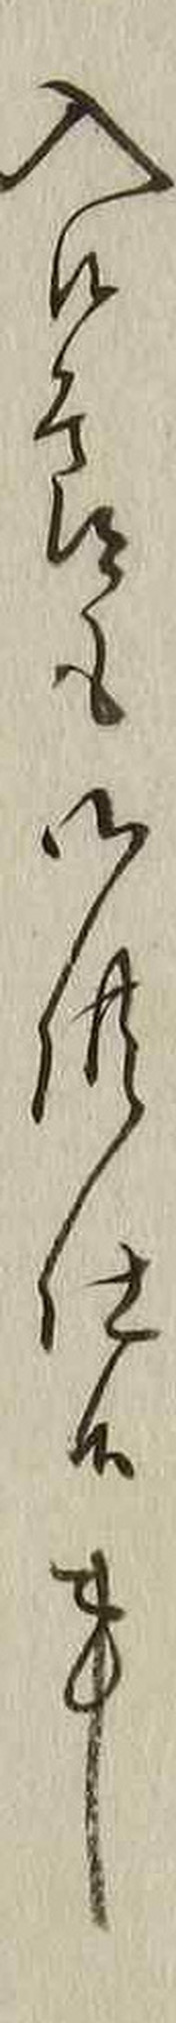入候節も御供仕候事
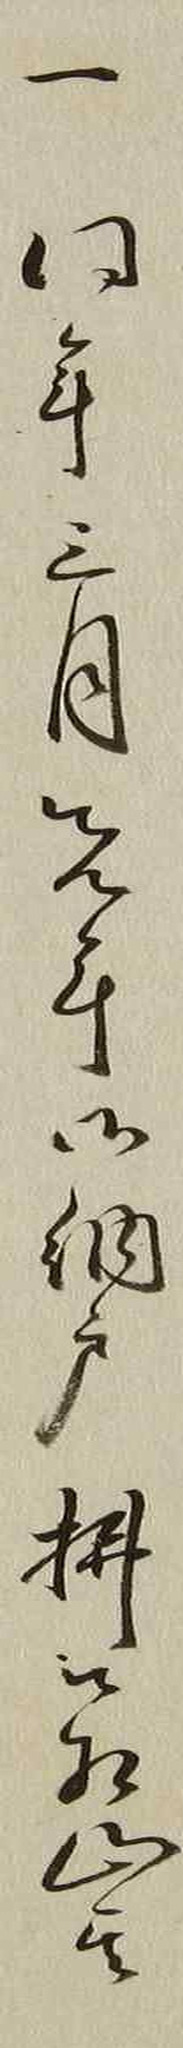一同年三月先年御納戸払被相止其
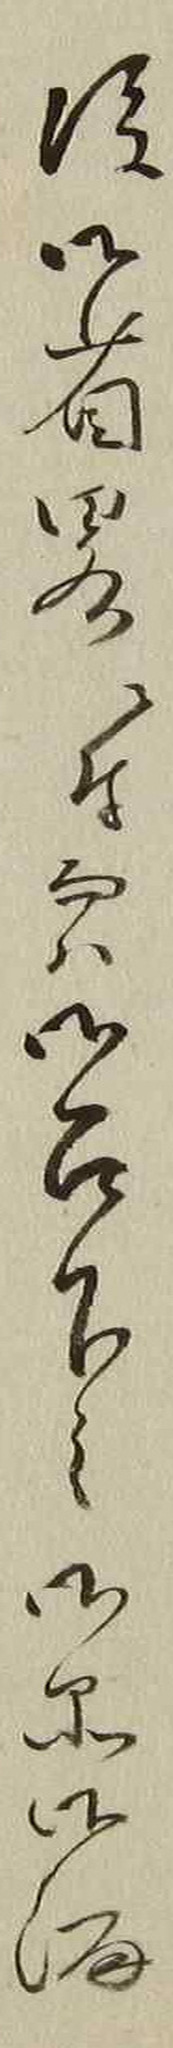後御省略ニ付而ハ御召下之御品御溜
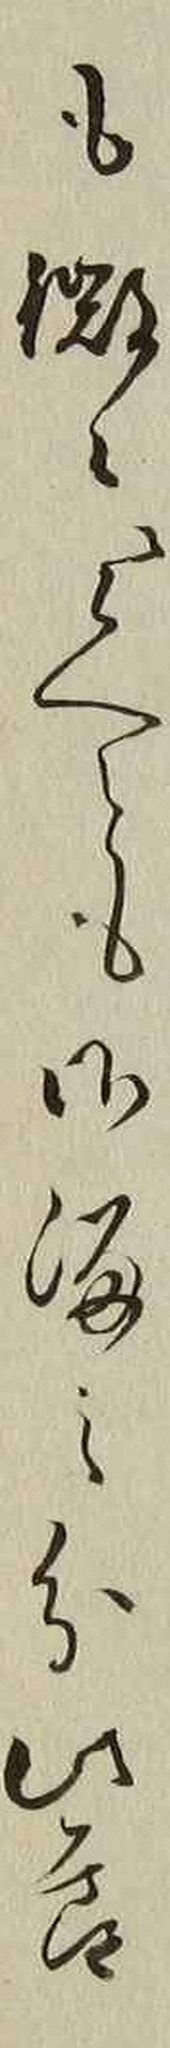も微々ニ候へとも御溜之分此節
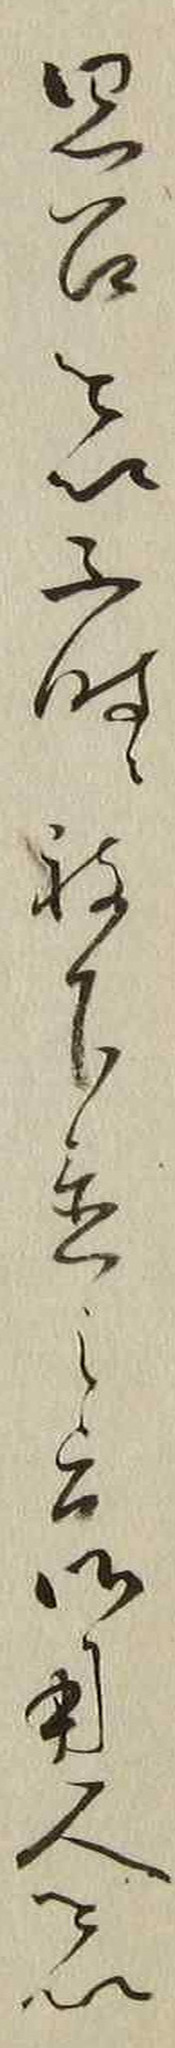思召を以不時ニ被下置之旨御用人を以
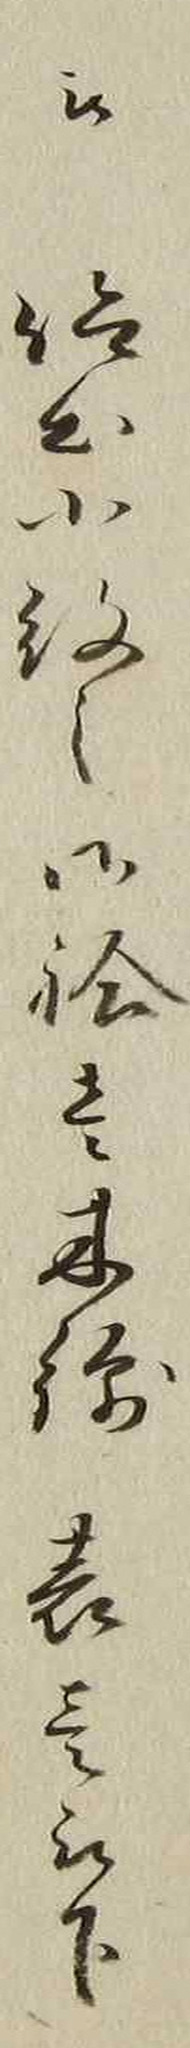被仰出小紋之御袷壱木綿表壱被下
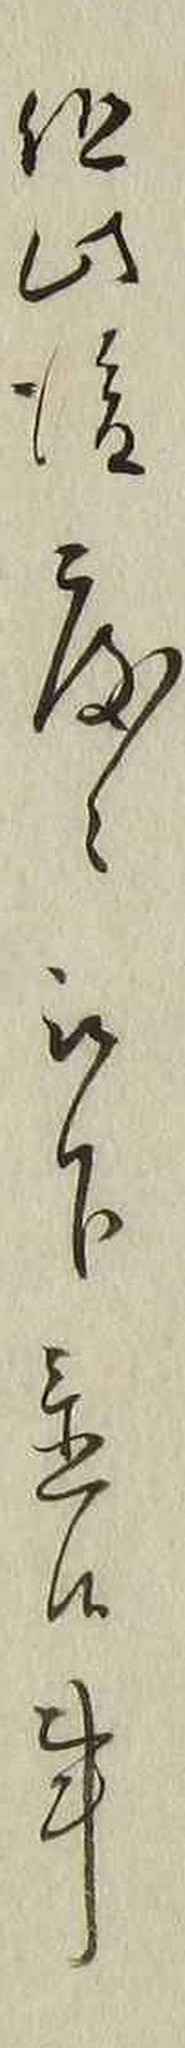但此後度々被下置候事
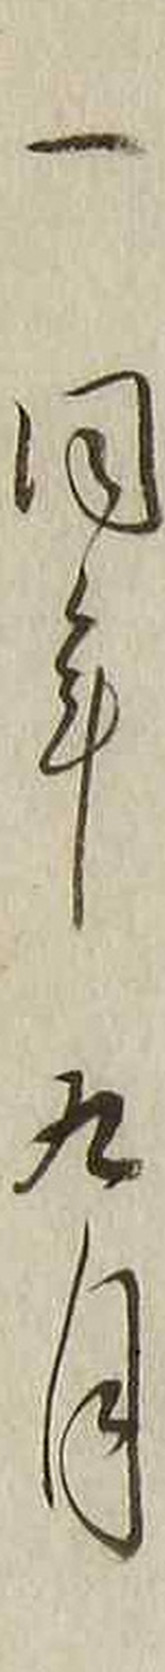一同年九月
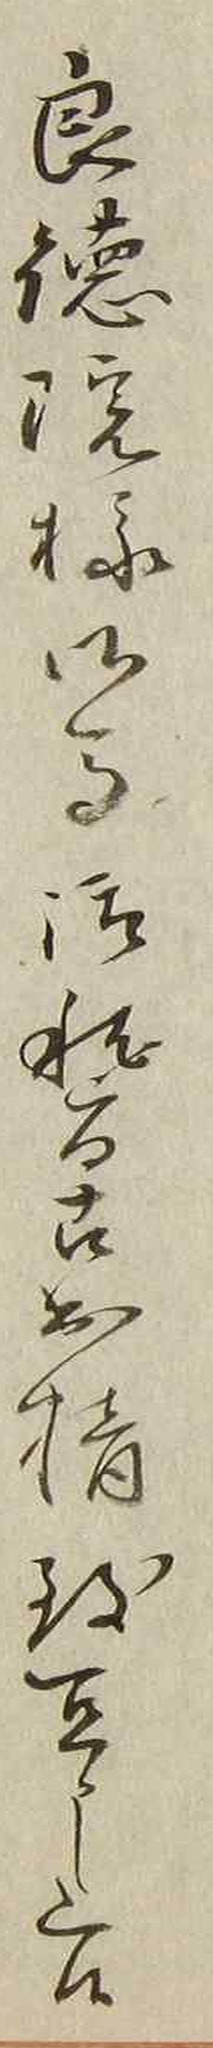良徳院様御馬御稽古出精致宜申上候
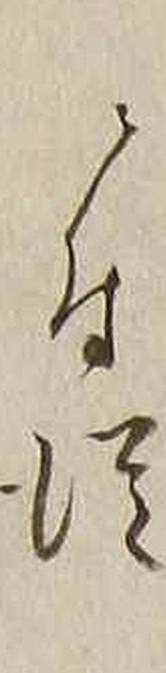ニ付従
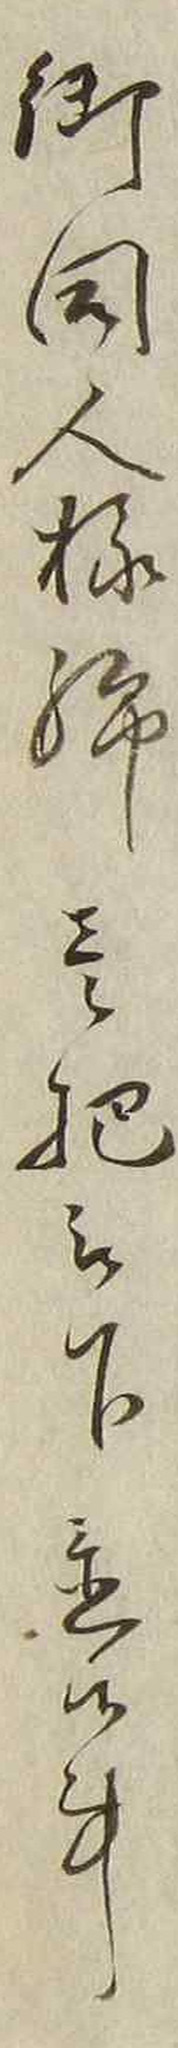御同人様綿壱把被下置候事

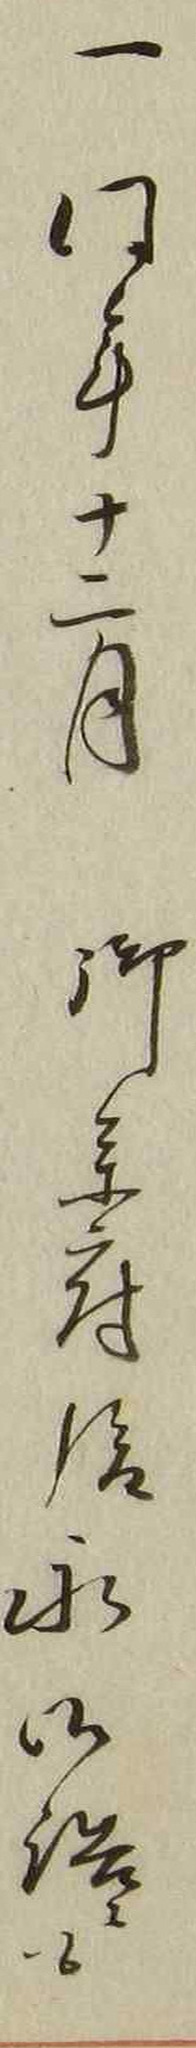一同年十二月御参符後永御詰ニも
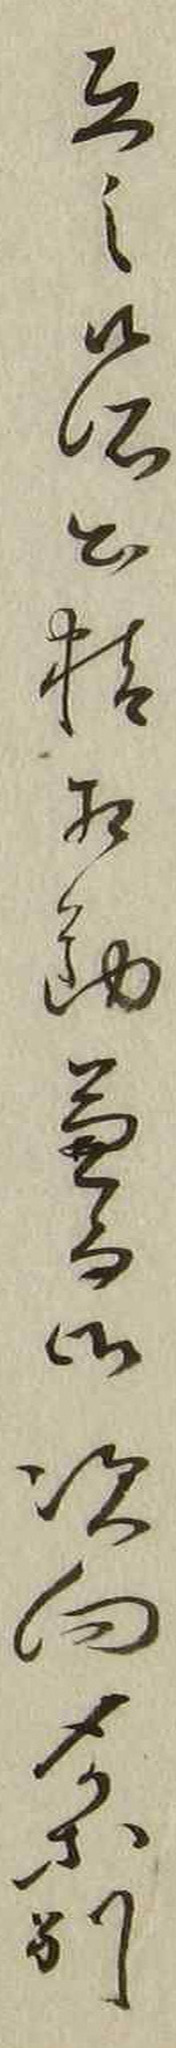在之候所出精相勤兼而御次向〆り等別
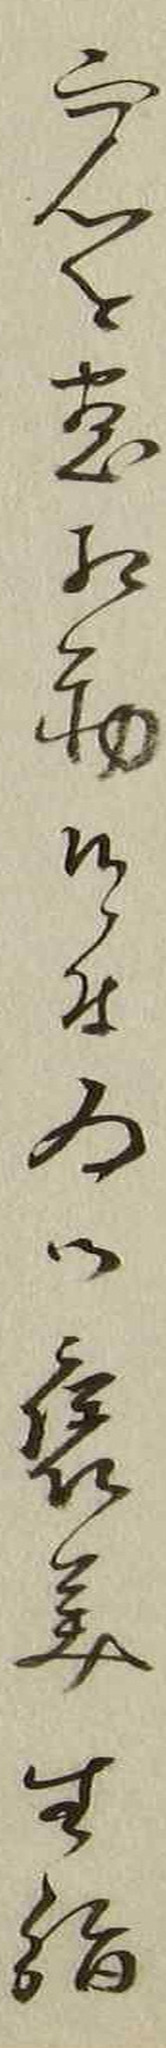而心を尽相勤候ニ付為御褒美生絹
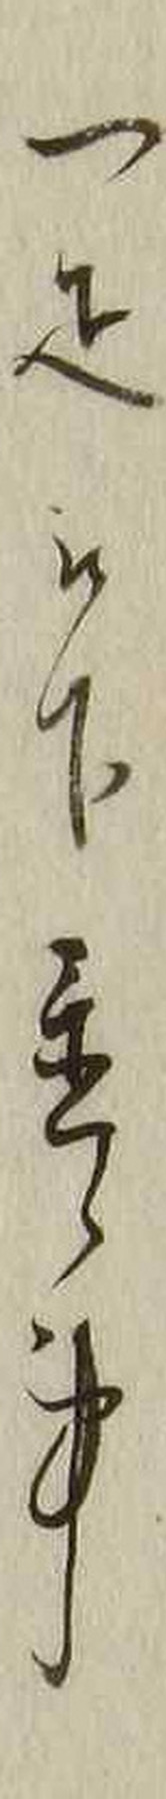一疋被下置候事
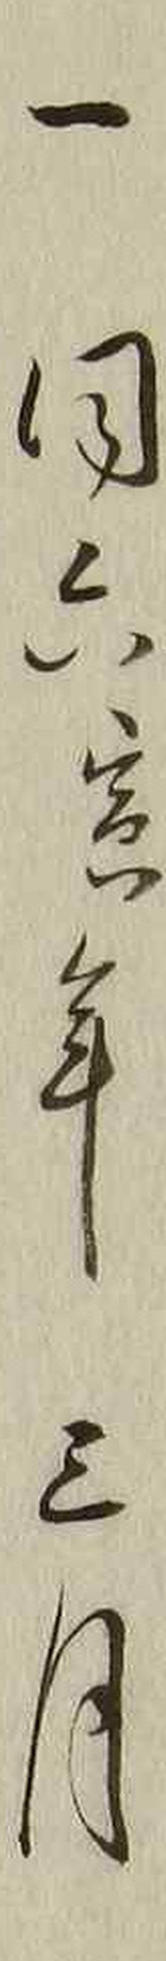一同六寅年三月
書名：諸士系譜　巻之25　い之部25
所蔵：会津若松市立会津図書館
